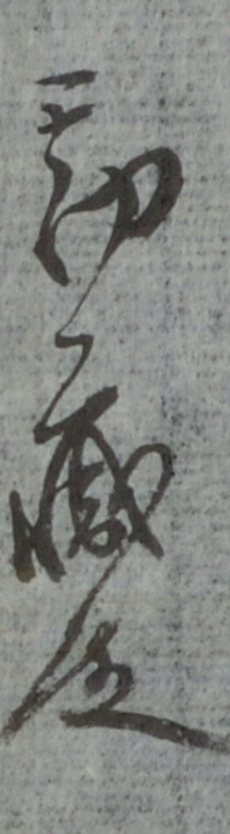勘蔵殿

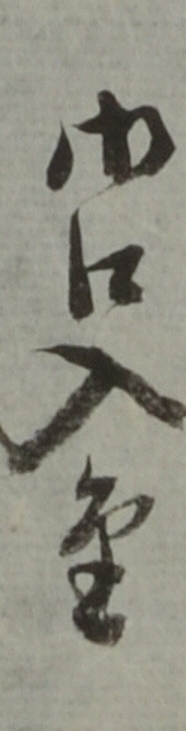御口入金
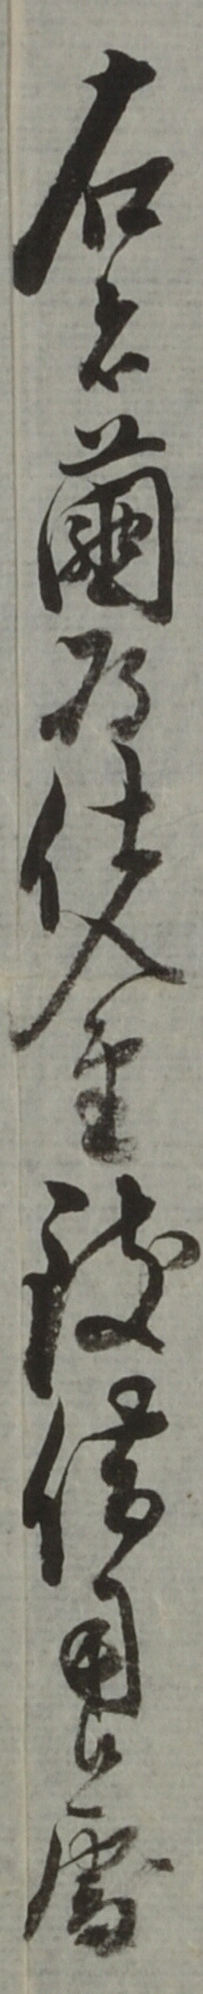右は繭為仕入金致借用候処
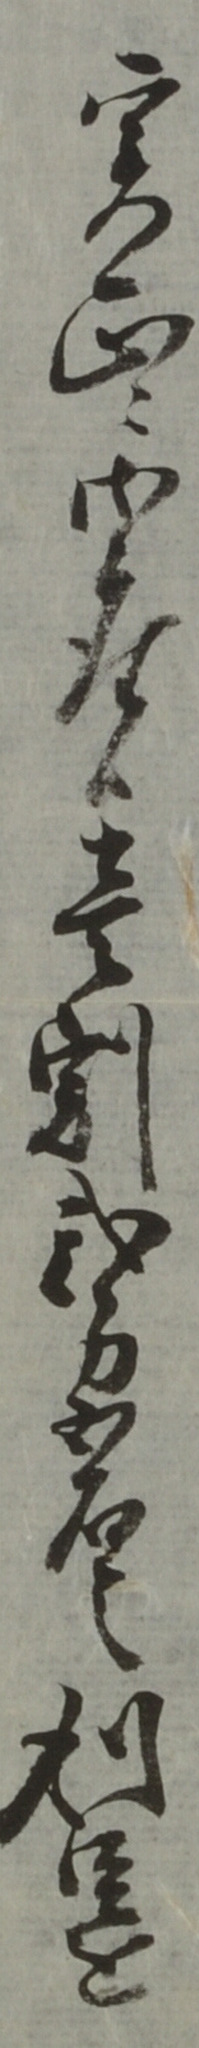実正ニ御座候壱割弐分五厘之利足を
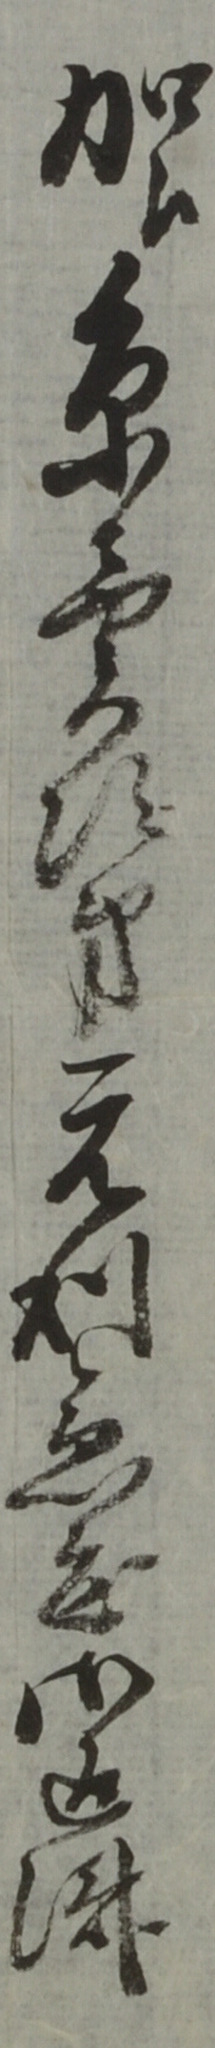加江糸売買次第元利急度御返済
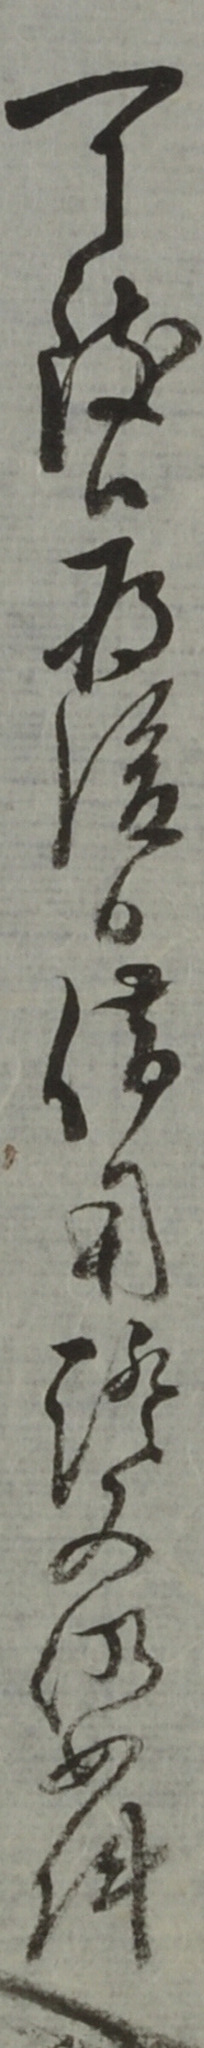可致候為後日借用証文仍如件
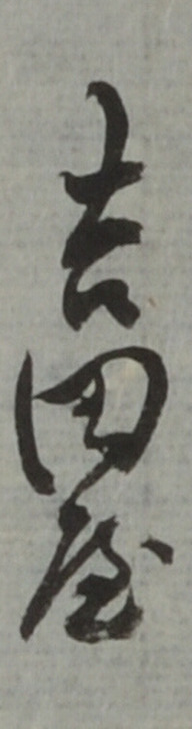吉田屋
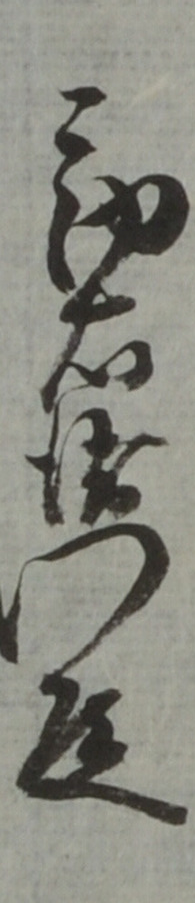勘右衛門殿
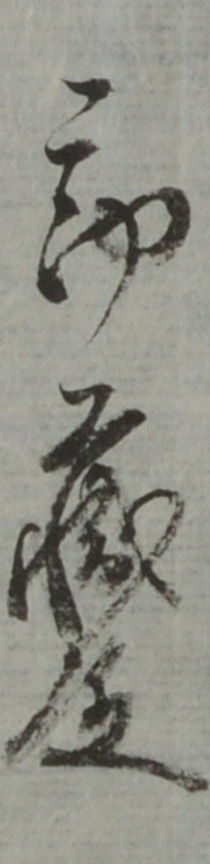勘蔵殿

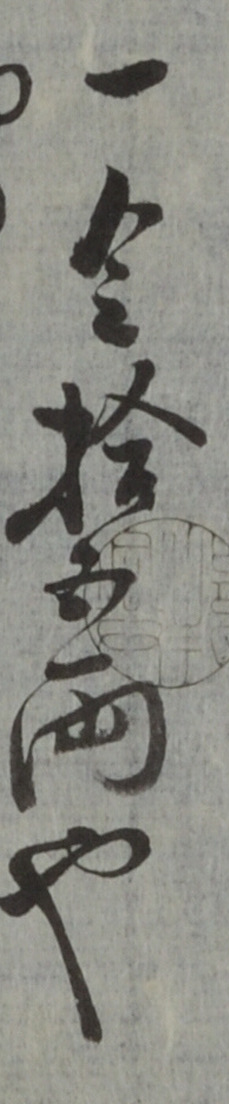一金拾五両也
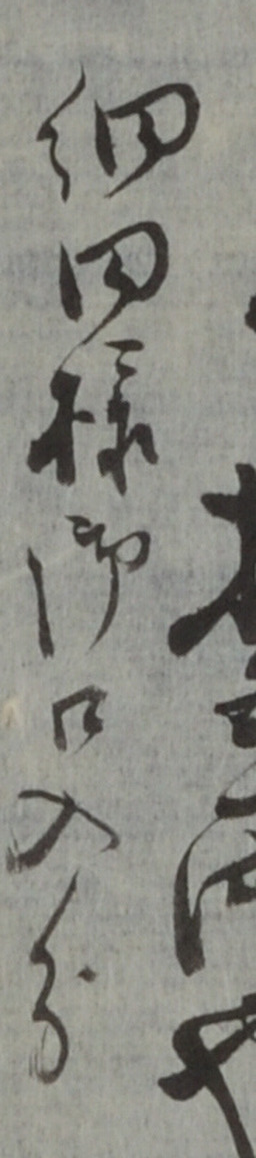細田様御口入分
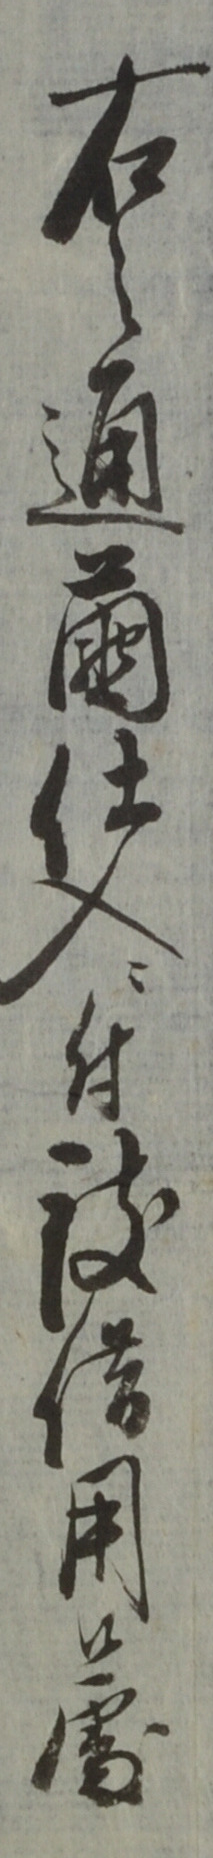右之通繭仕入ニ付致借用候処
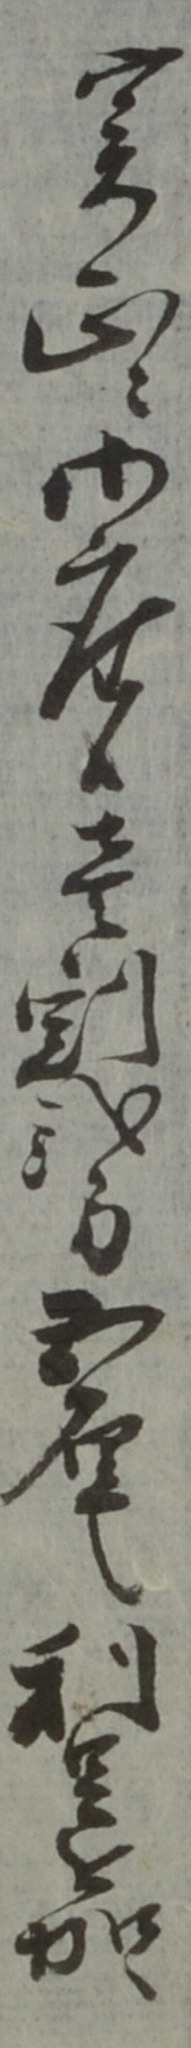実正ニ御座候壱割弐分五厘之利足を加へ
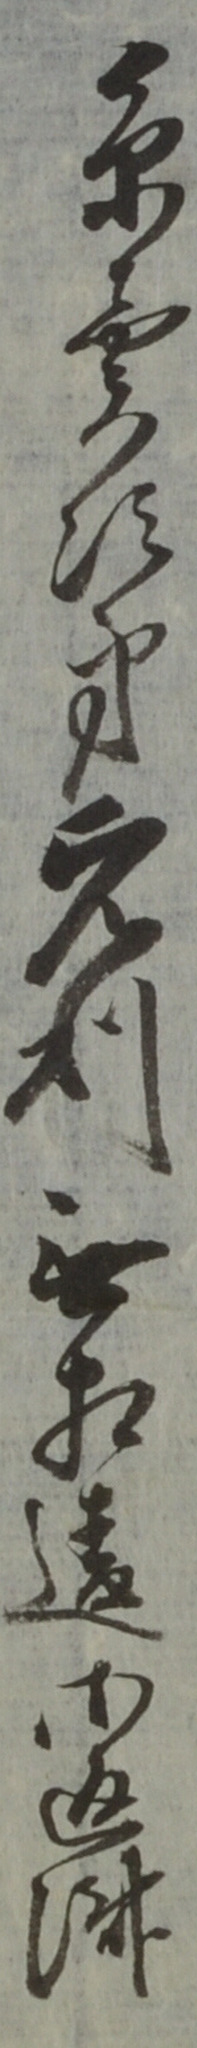糸売次第元利無相違御返済
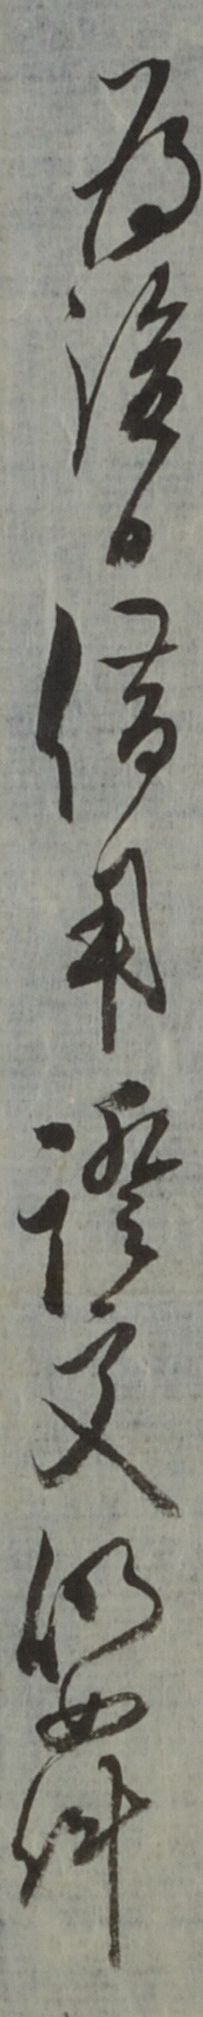為後日借用証文仍如件
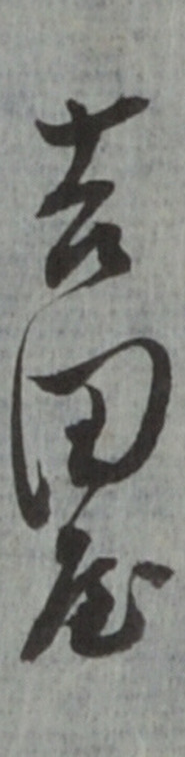吉田屋
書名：拝借證文之事
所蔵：伊那市立高遠町図書館・合同会社AMANE
